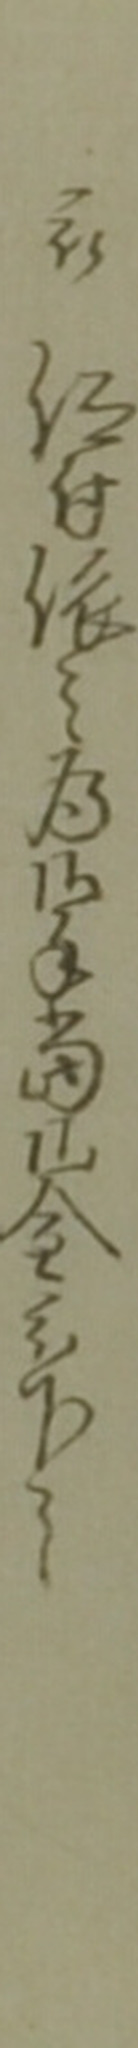被仰付依之為御手当御金被下之
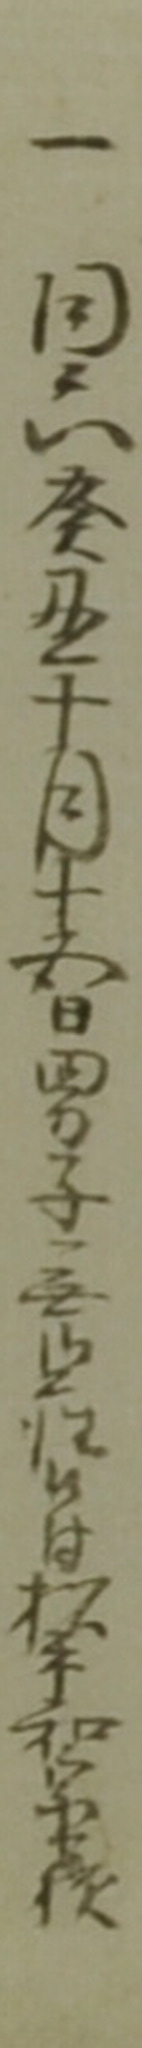一同六癸丑十月十五日男子無御座候付松平和泉守様
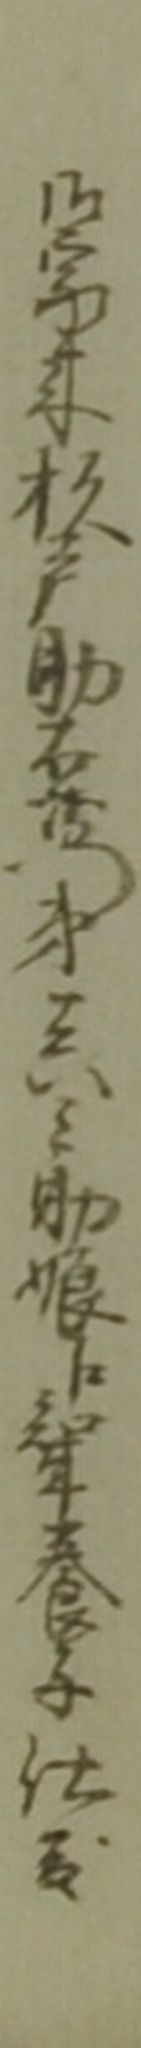御家来杉戸助右衛門弟真之助娘え聟養子仕度
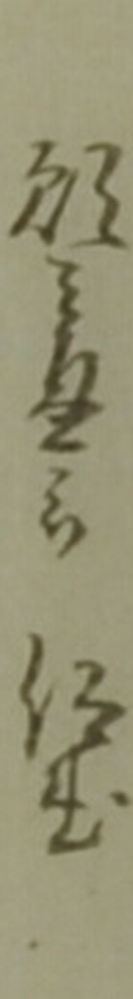願之通被仰出
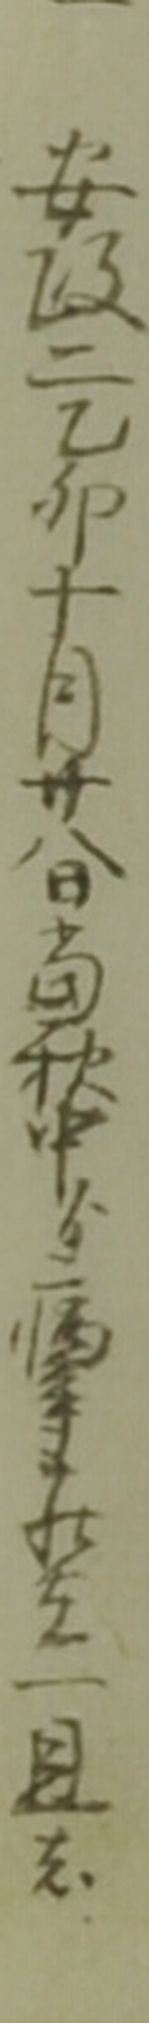一安政二乙卯十月廿八日当秋中ゟ病気罷在一旦者
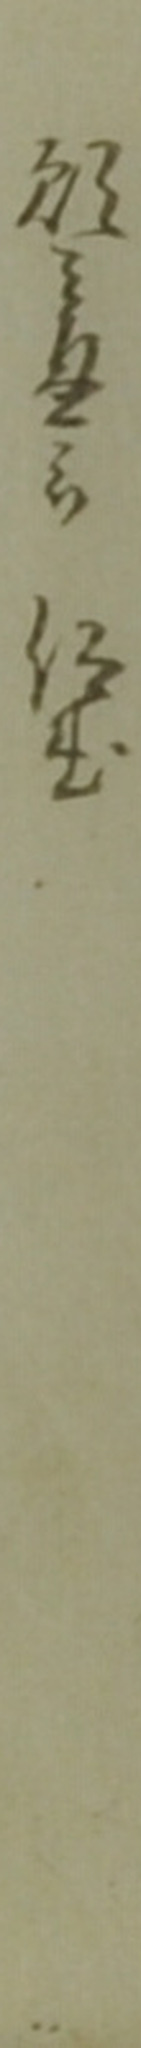願之通被仰出
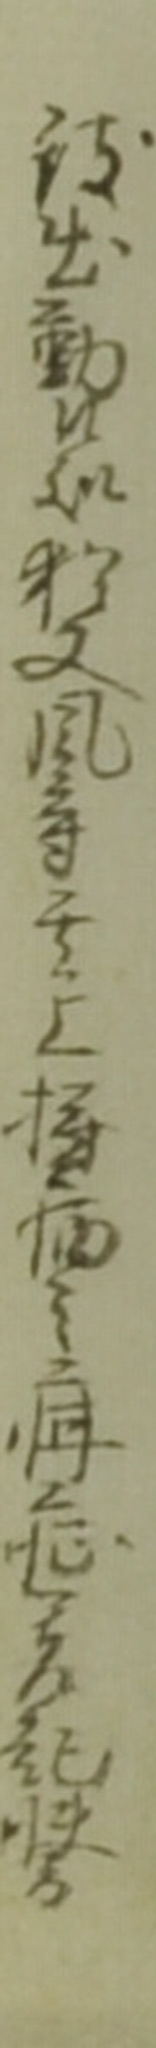致出勤候処猶又風気其上持病之症差起快方

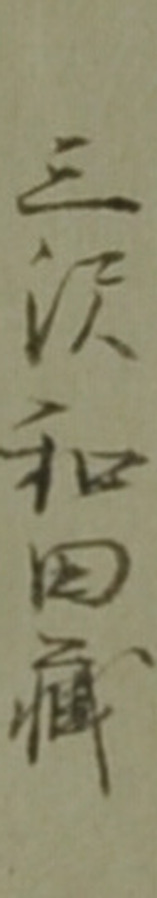三沢和田蔵

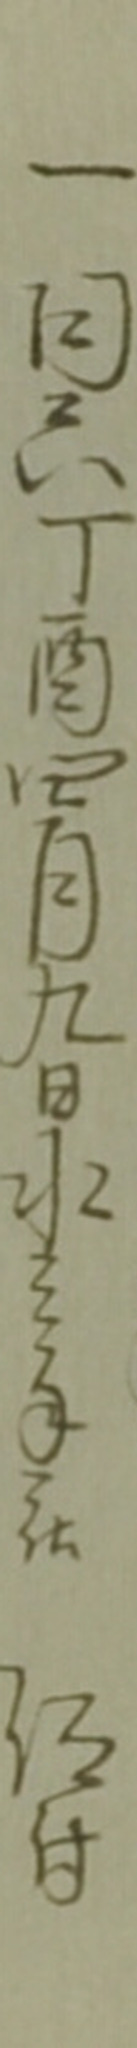一同六丁酉四月九日水之手被仰付
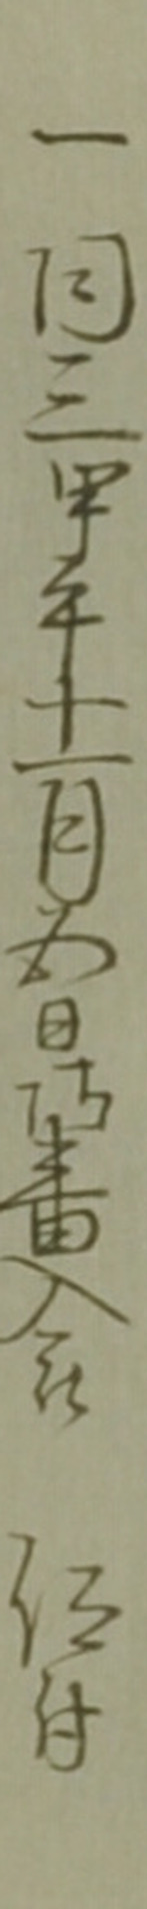一同三甲午十一月五日御番入被仰付
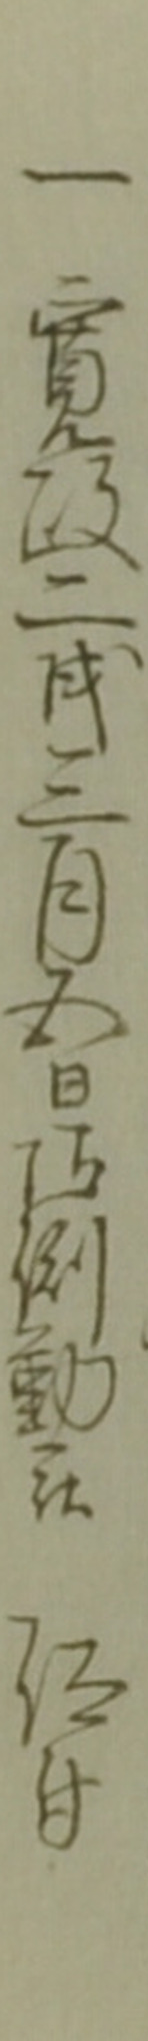一寛政二戌三月五日御側勤被仰付
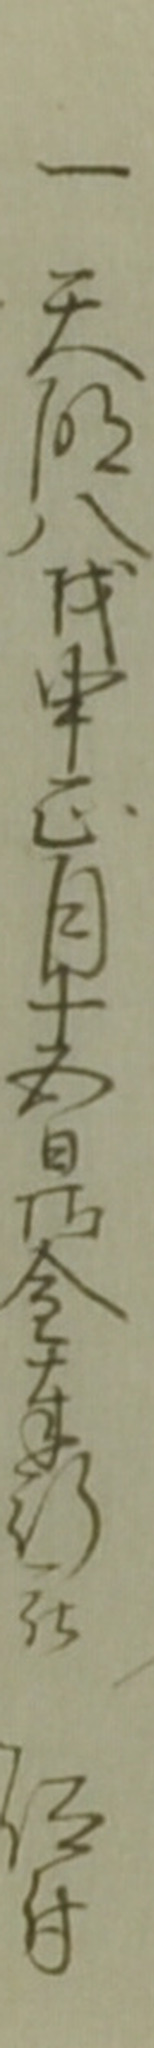一天明八戊申正月十五日御金奉行被仰付
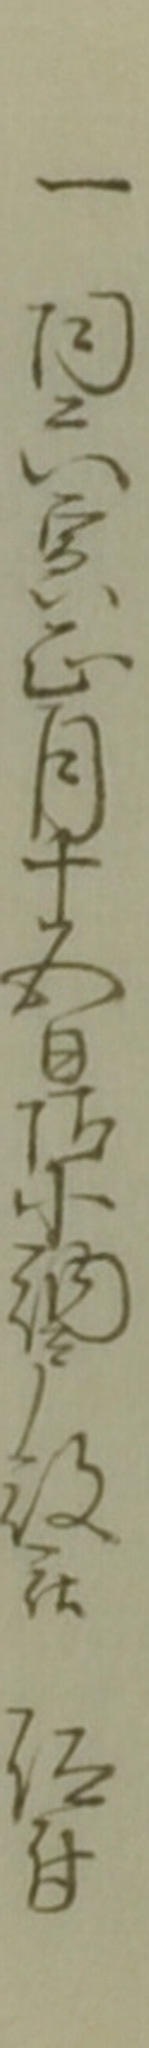一同六寅正月十五日御小納戸役被仰付
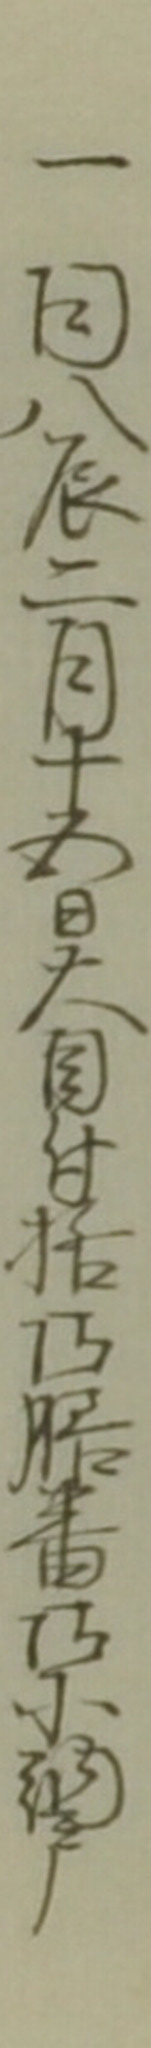一同八辰二月十五日大目付格御膳番御小納戸
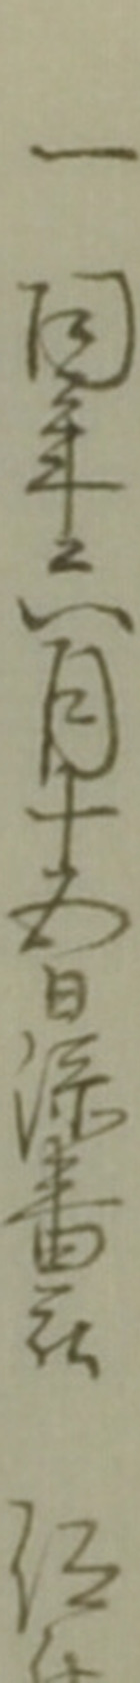一同年六月十五日添番被仰付
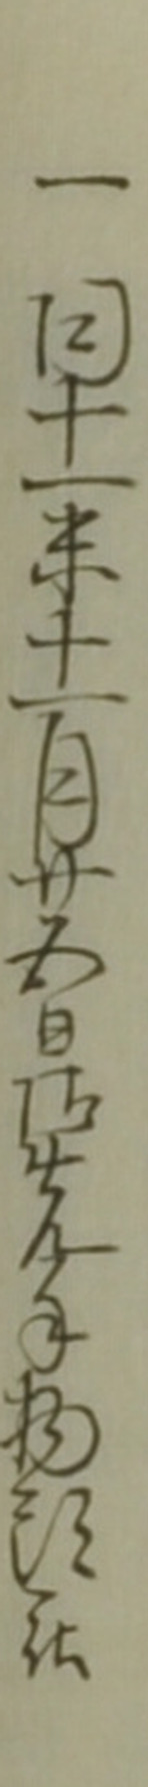一同十一未十一月廿五日御先手物頭被
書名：給人諸士勤仕録（三）
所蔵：伊那市立高遠町図書館・合同会社AMANE
